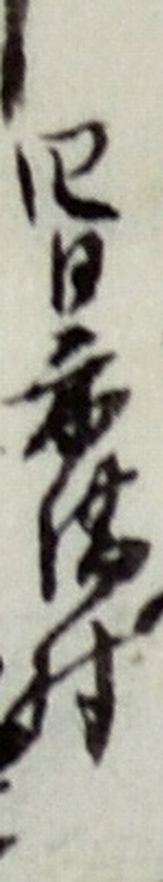四日市場村

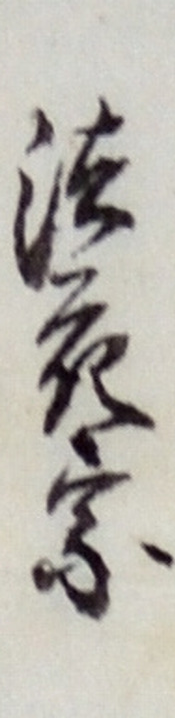法花宗
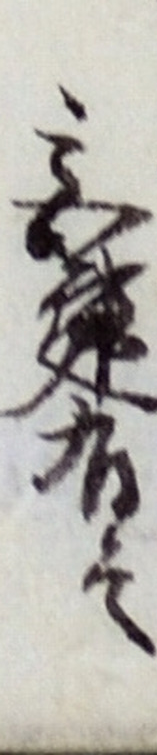宮建有之
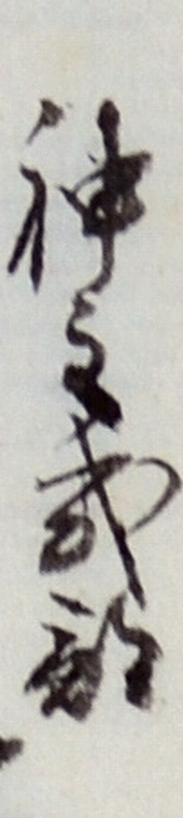神主式部
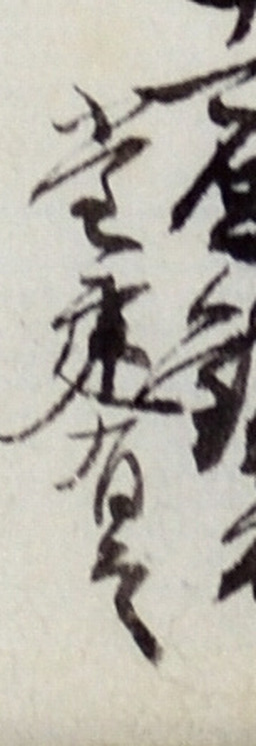堂建有之
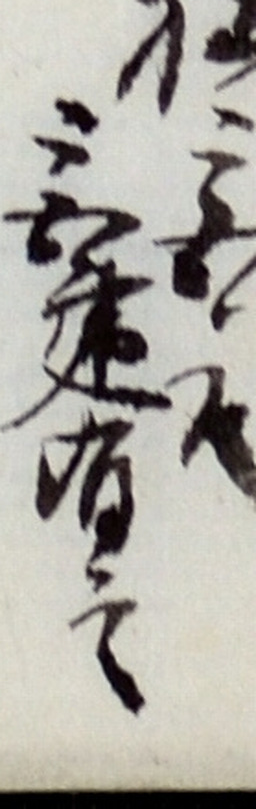宮建有之
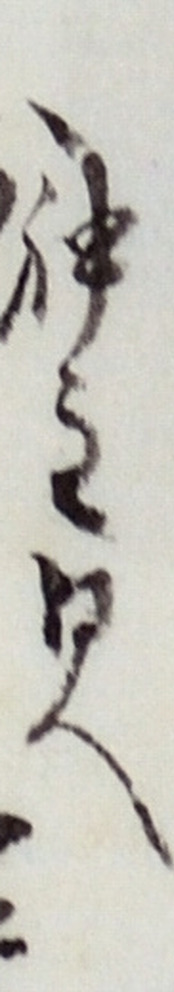神主同人
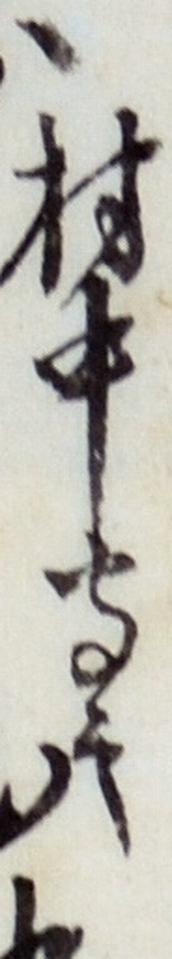村中守之
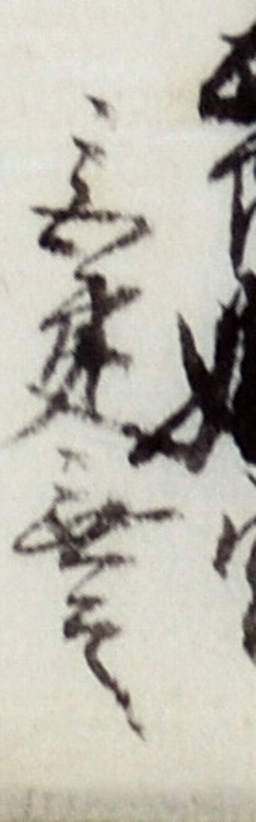宮建無之
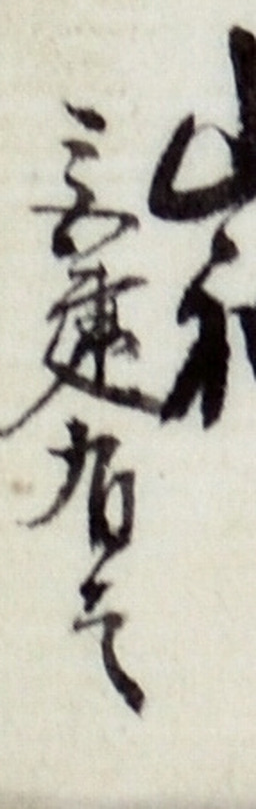宮建有之
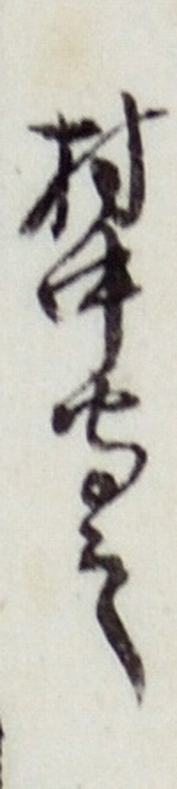村中守之
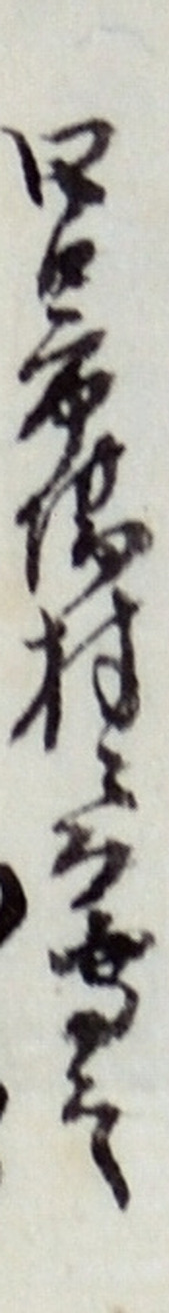四日市場村ニ而守之
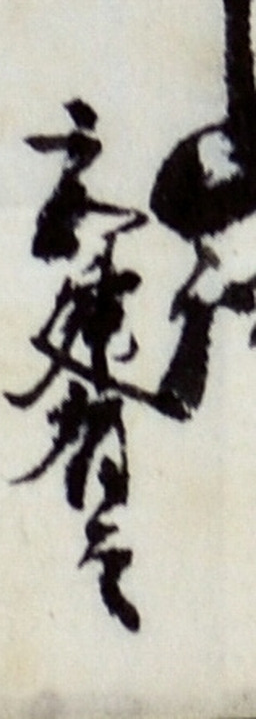宮建有之
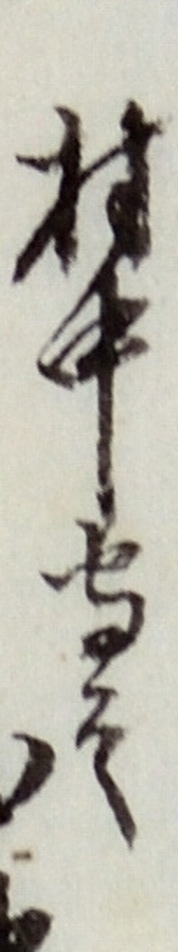村中守之
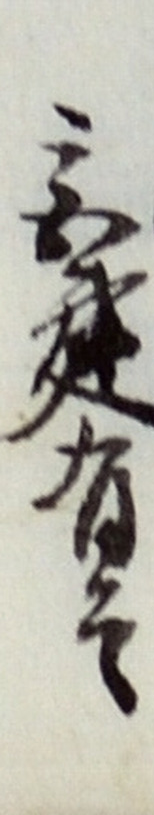宮建有之
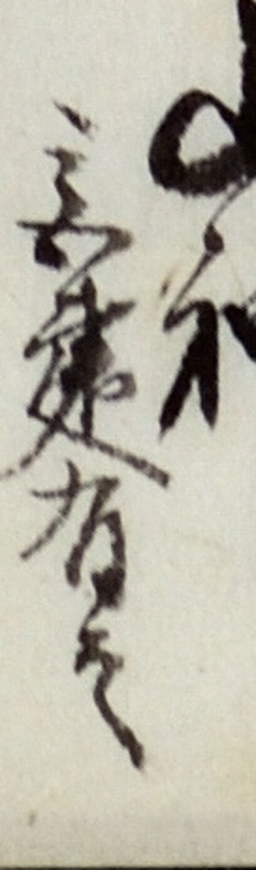宮建有之
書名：御領分中山林社地手控
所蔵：伊那市立高遠町図書館・合同会社AMANE
